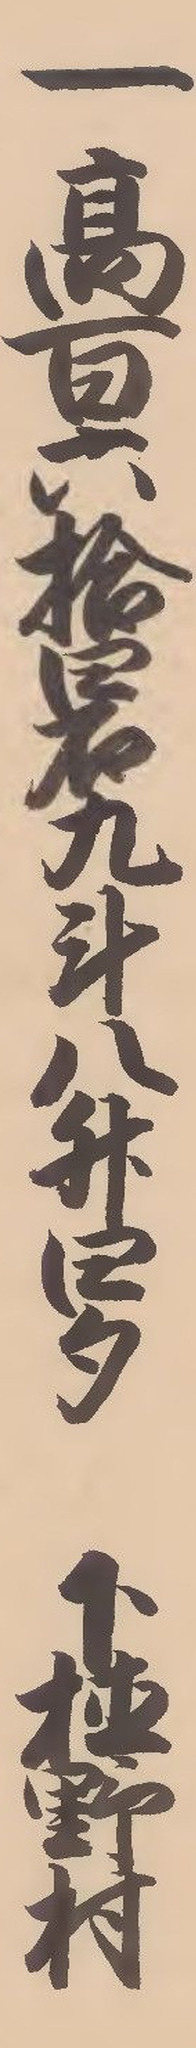一髙百六拾四石九斗八升四夕下植野村
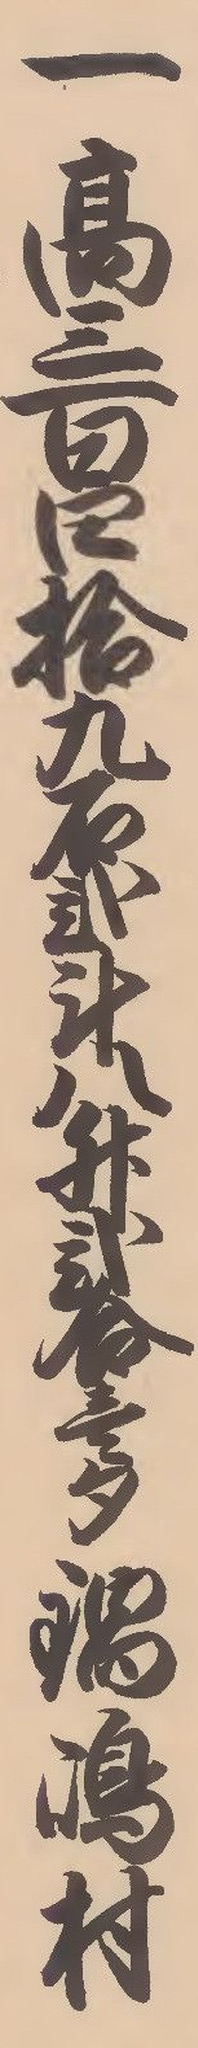一髙三百四拾九石弐斗八升弐合壱夕鍋嶋村

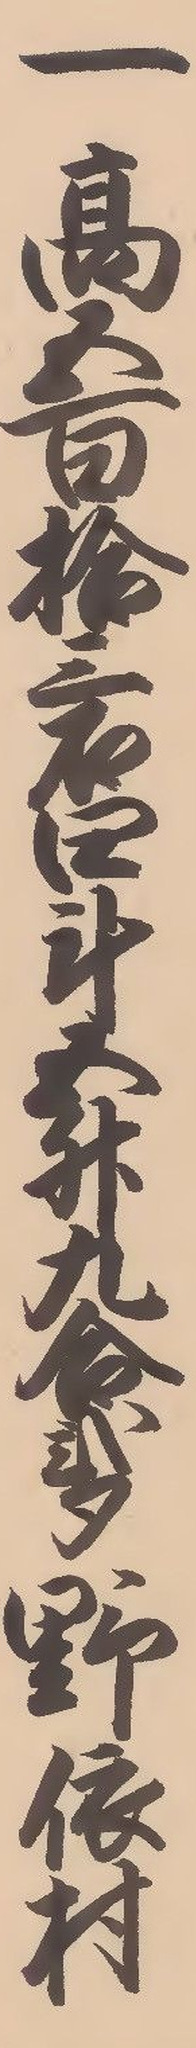一髙五百拾三石四斗五升九合弐夕野依村
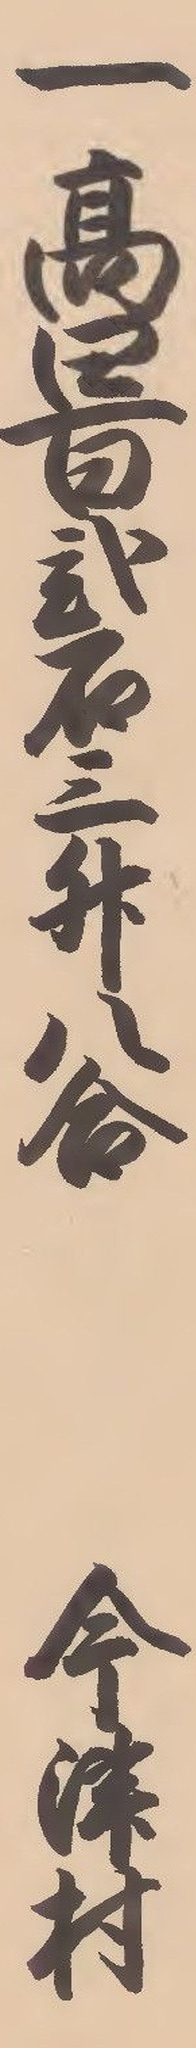一髙四百弐石三升八合今津村
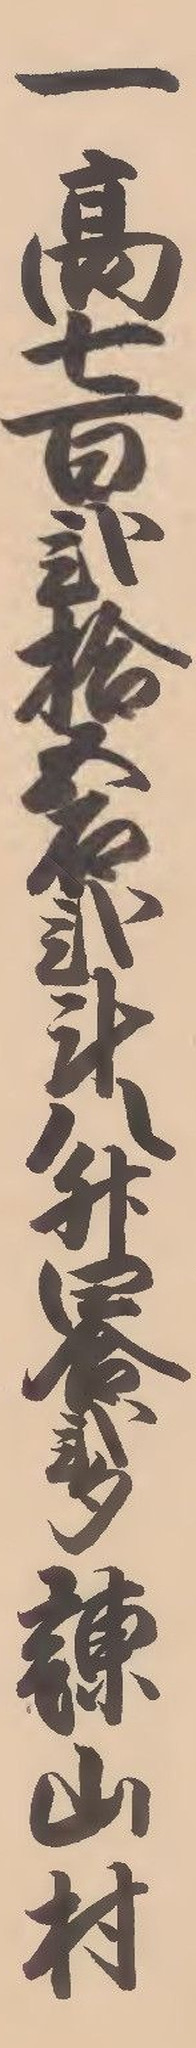一高七百弐拾五石弐斗八升四合弐夕諌山村
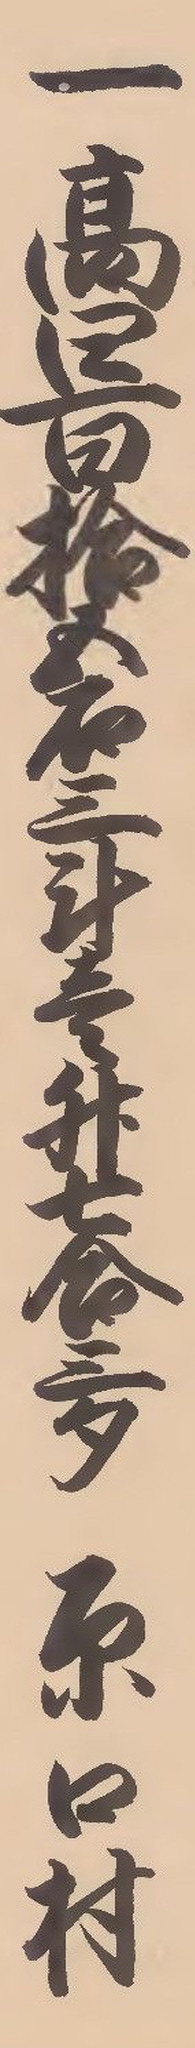一髙四百拾五石三斗壱升七合三夕原口村
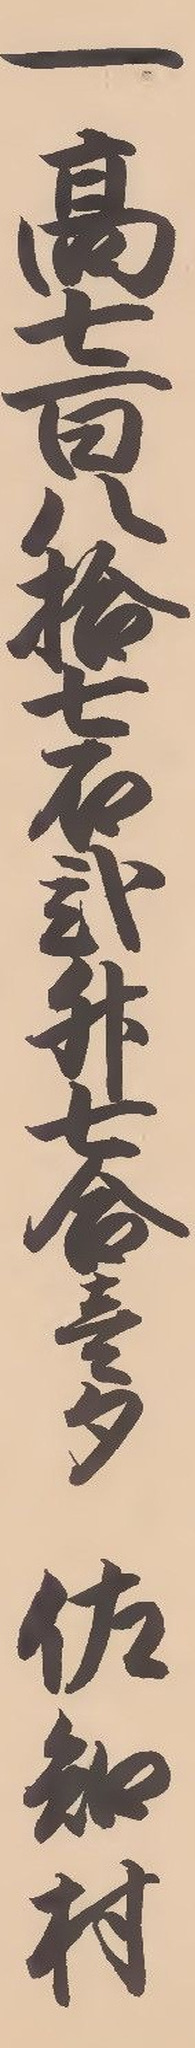一髙七百八拾七石弐升七合壱夕佐知村
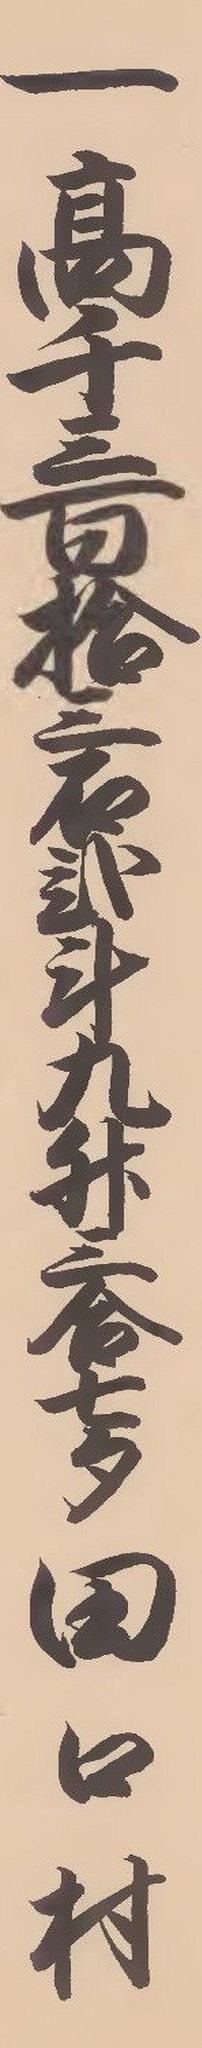一髙千三百拾三石弐斗九升三合七夕田口村
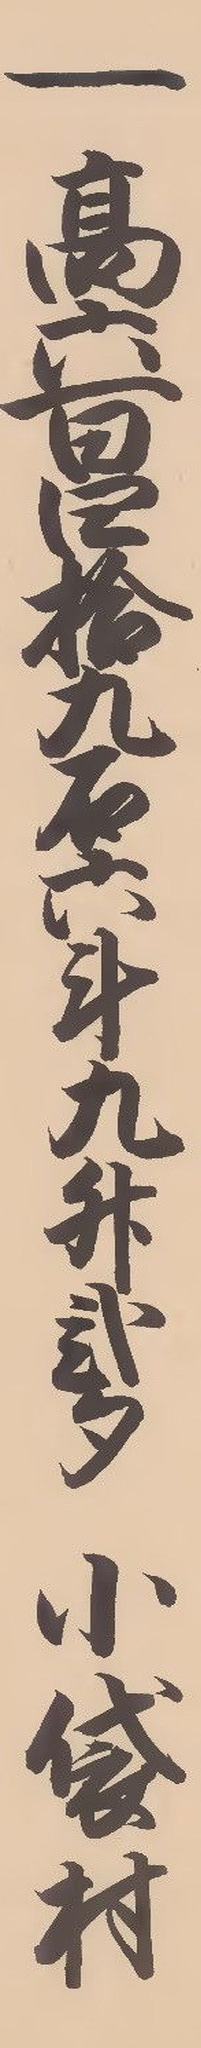一高六百四拾九石六斗九升弐夕小袋村
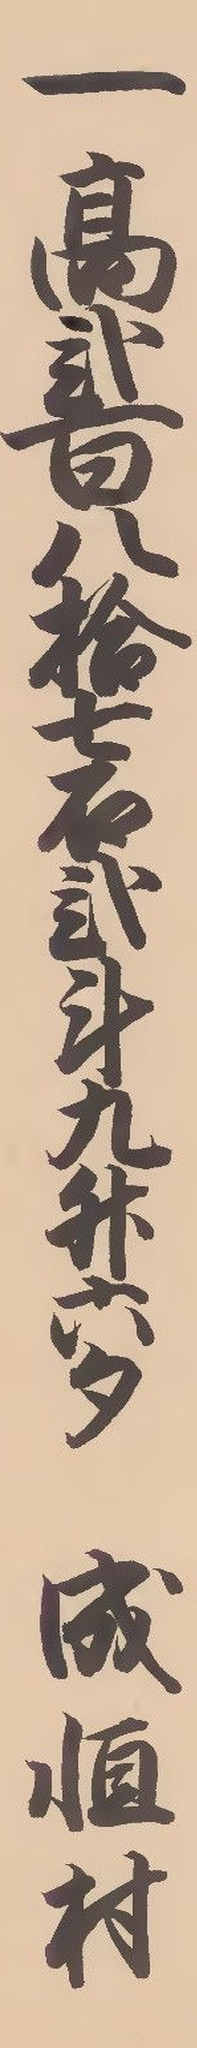一髙弐百八拾七石弐斗九升六夕成恒村

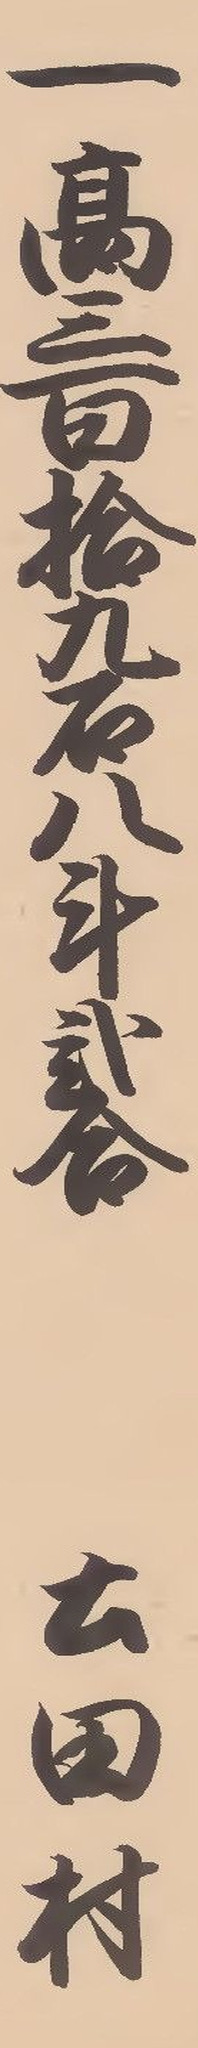一髙三百拾九石八斗弐合土田村
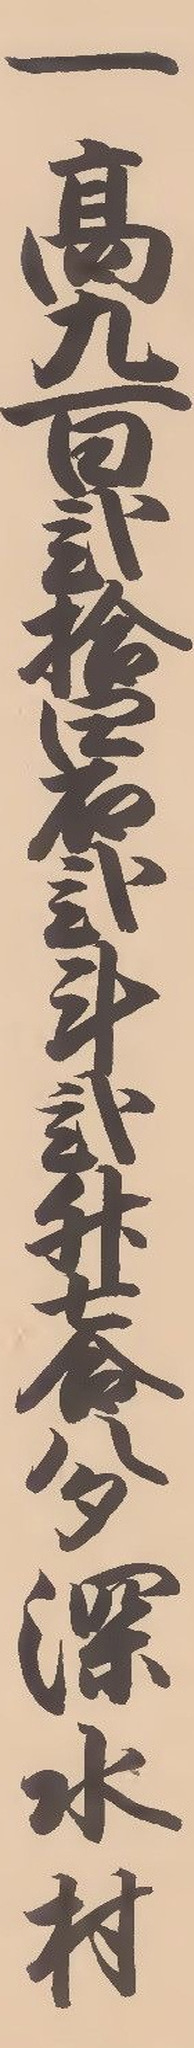一髙九百弐拾四石弐斗弐升七合八夕深水村
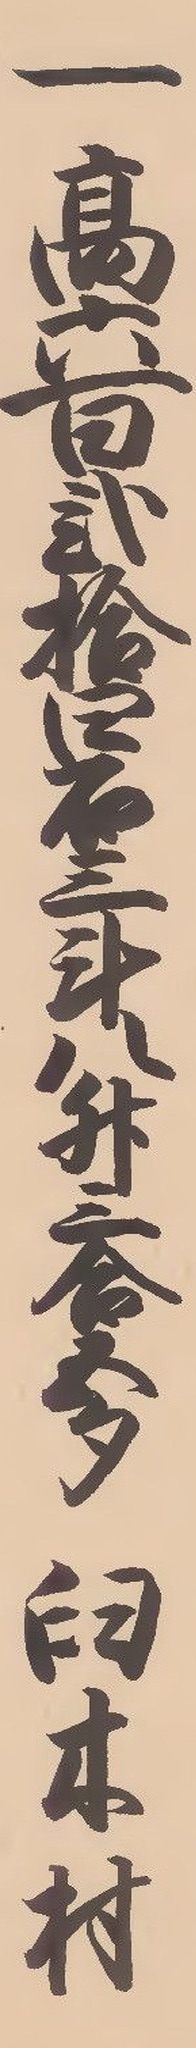一髙六百弐拾四石三斗八升三合五夕臼木村
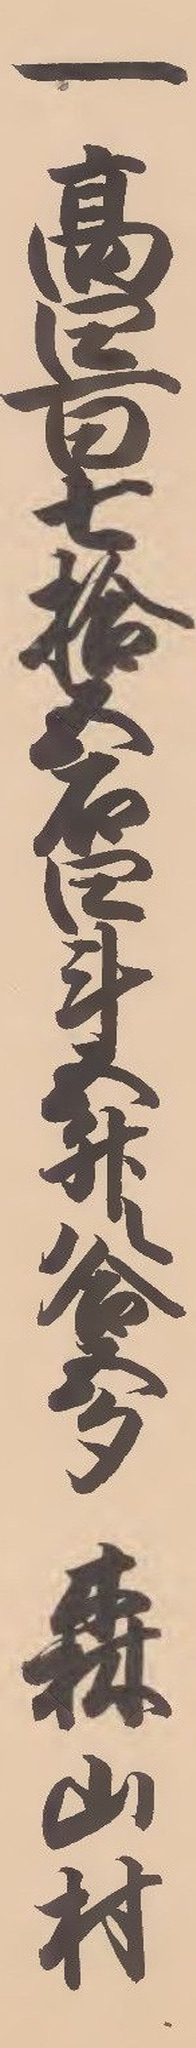一髙四百七拾五石四斗五升八合五夕森山村
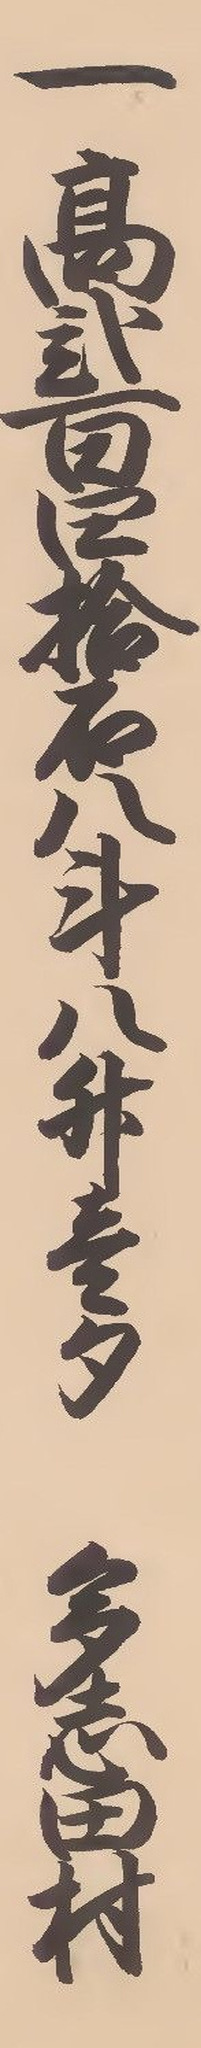一髙弐百四拾石八斗八升壱夕多志田村
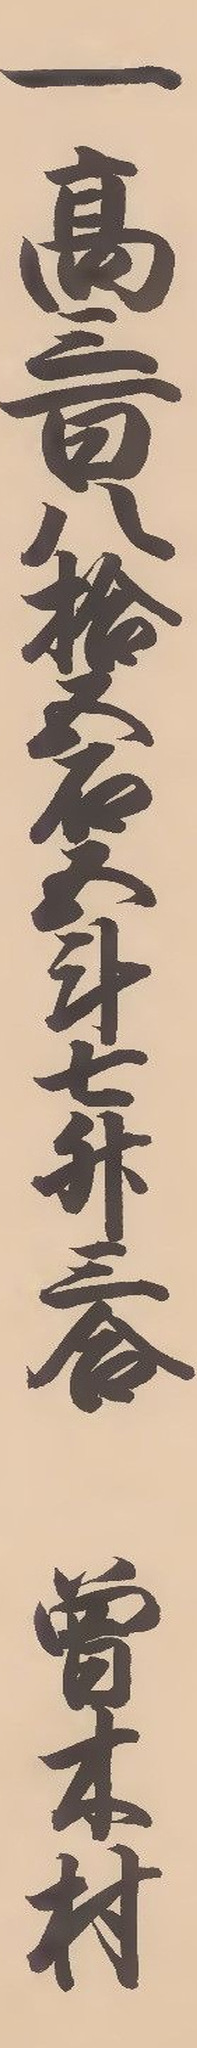一髙三百八拾五石五斗七升三合曽木村
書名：豊前国郷帳
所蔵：国立公文書館 National Archives of Japan
